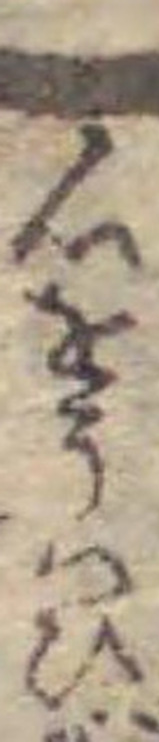心をうはひ
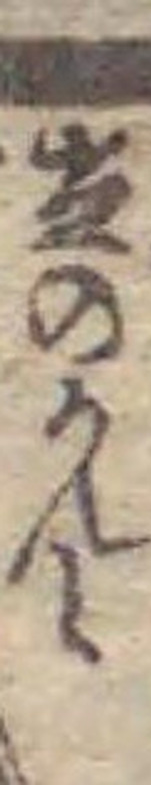立のかんと
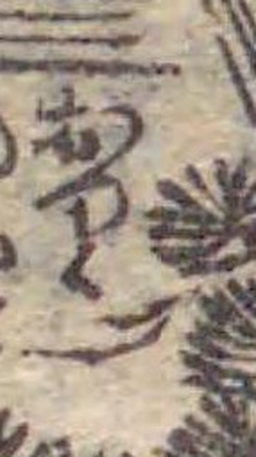おつと
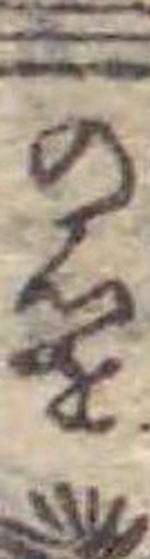の心を
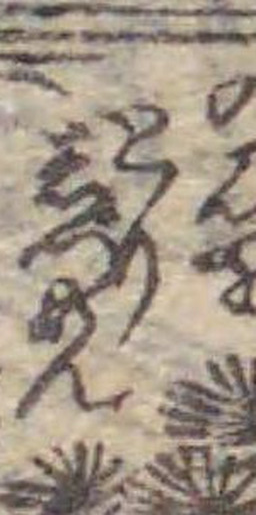しつめん
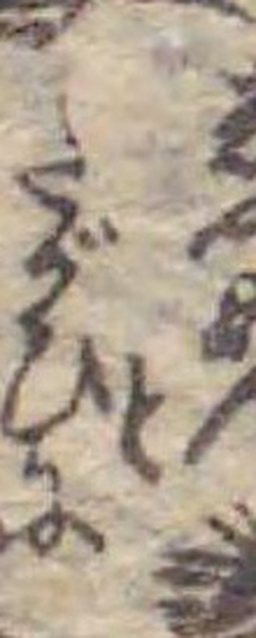たがひに
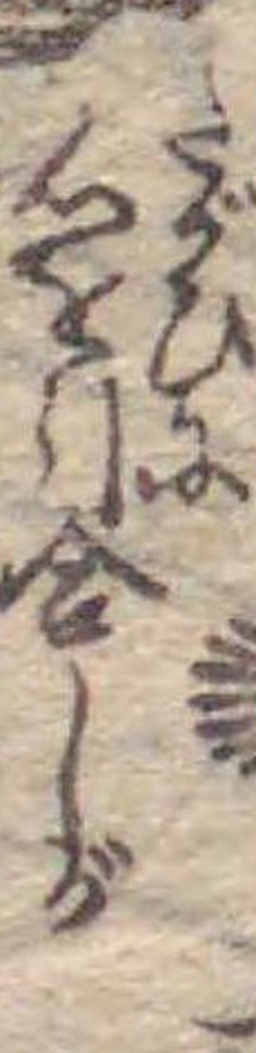心を引合しが
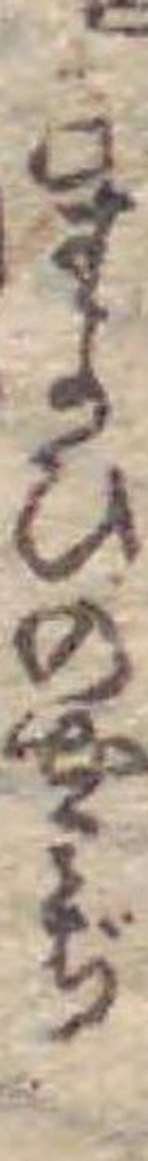まよひのやみぢ
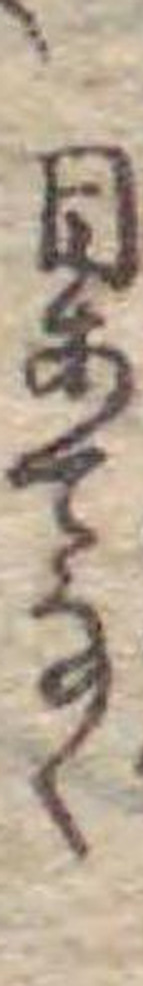目あてなく
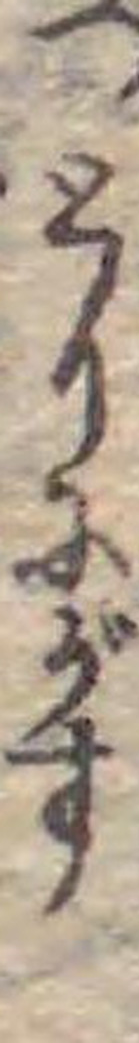とりにがす
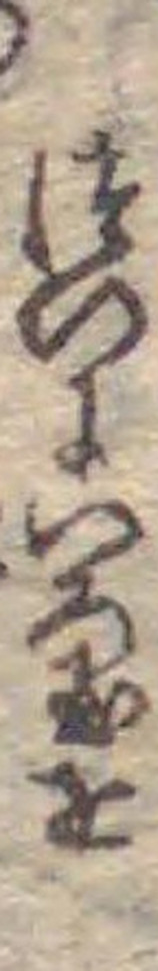ついにいろ玉を
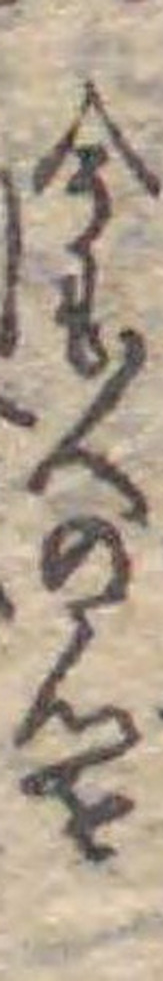今も人の心を
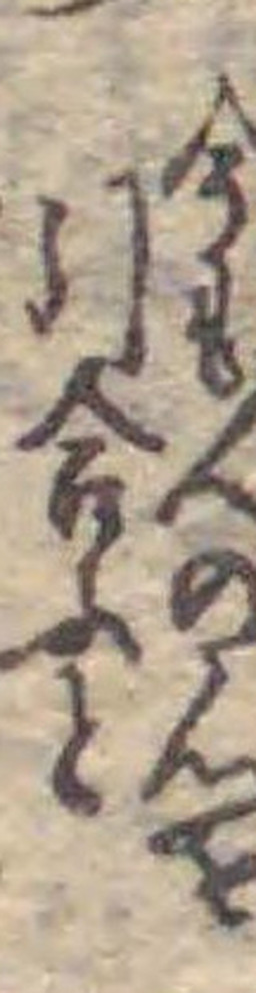引会ふと
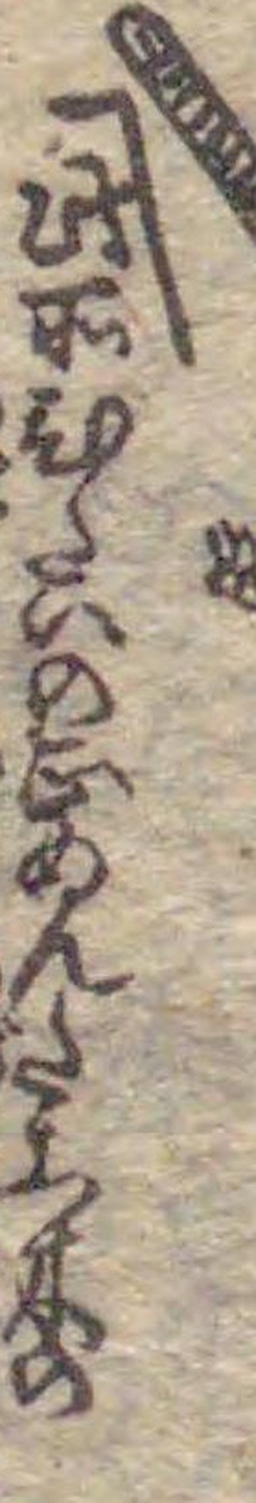〽此所ひたいの正めんたち木の
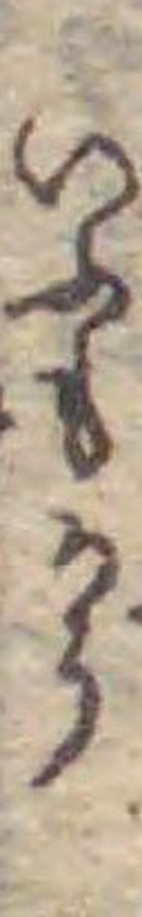いふもかう
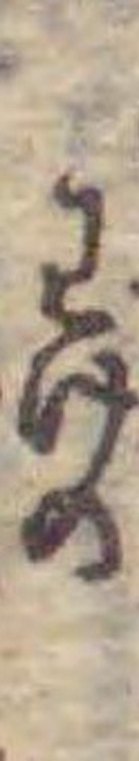わけの
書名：四遍搨心学草帋 : 3巻
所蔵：国立国会図書館 National Diet Library, JAPAN
